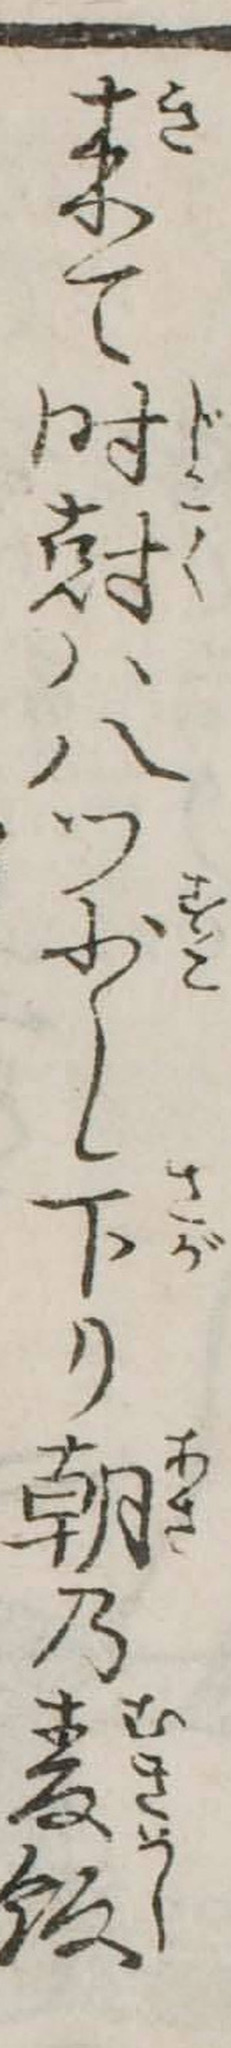来て時刻は八ツ少し下り朝の麦飯
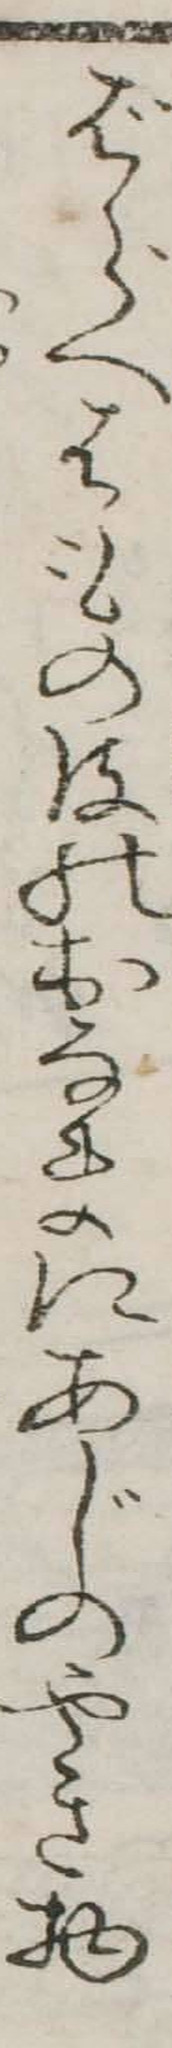ばらへはもの皮の出るまにあじのやき物
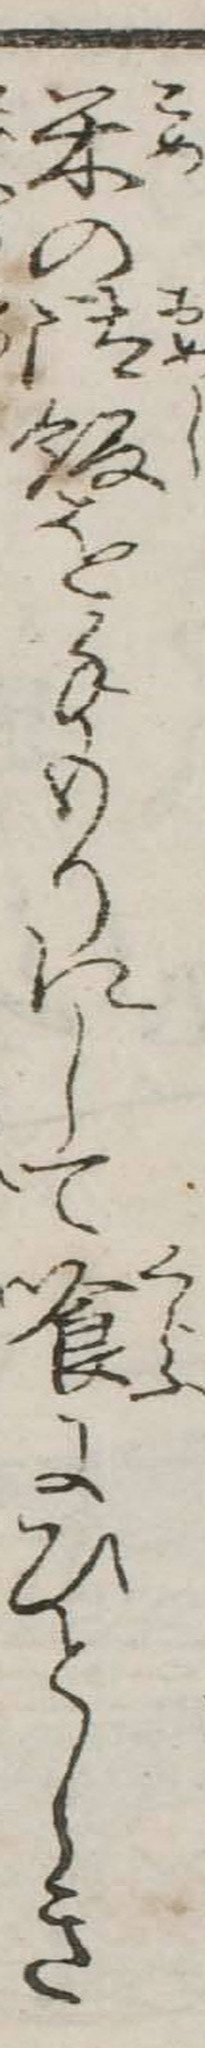米の御飯を手もりにして喰にひとしき
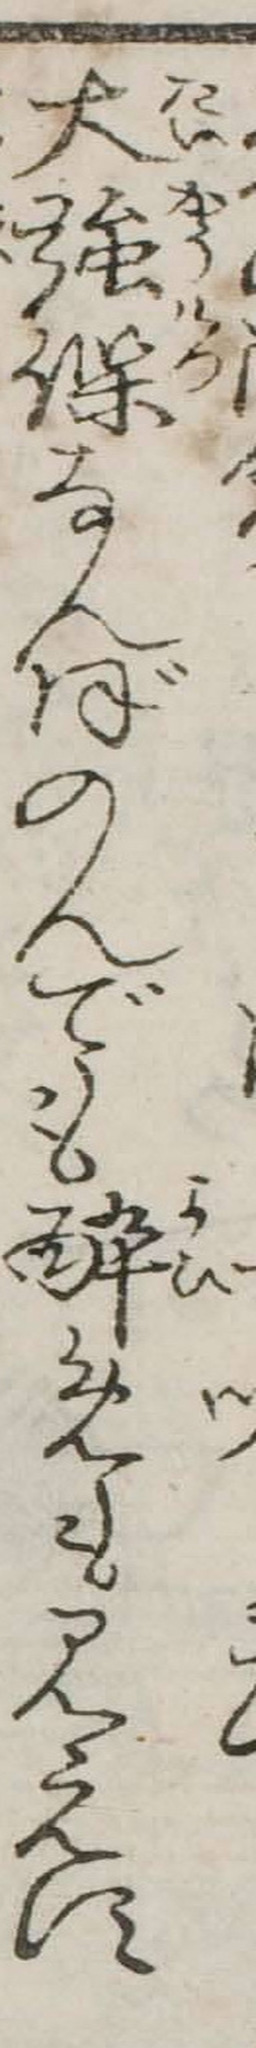大強傑なんぼのんでも酔めも見えす
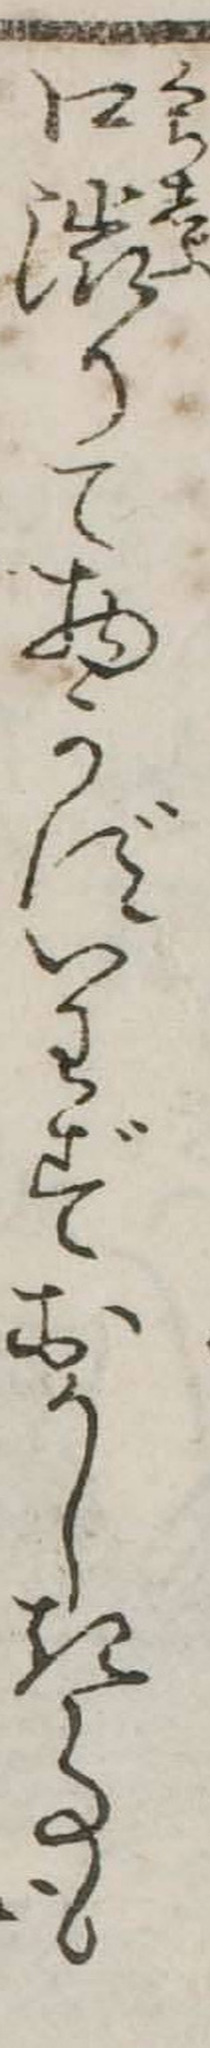口渋りて物かずいわずおかしき事も
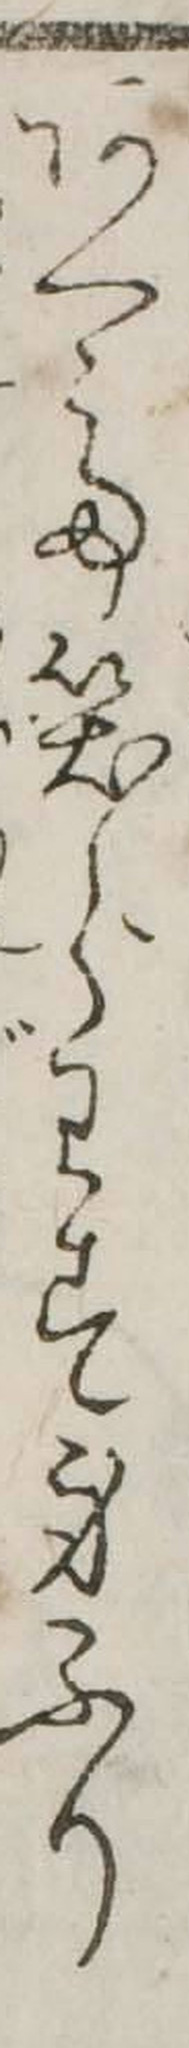あつて笑らわす身ふり
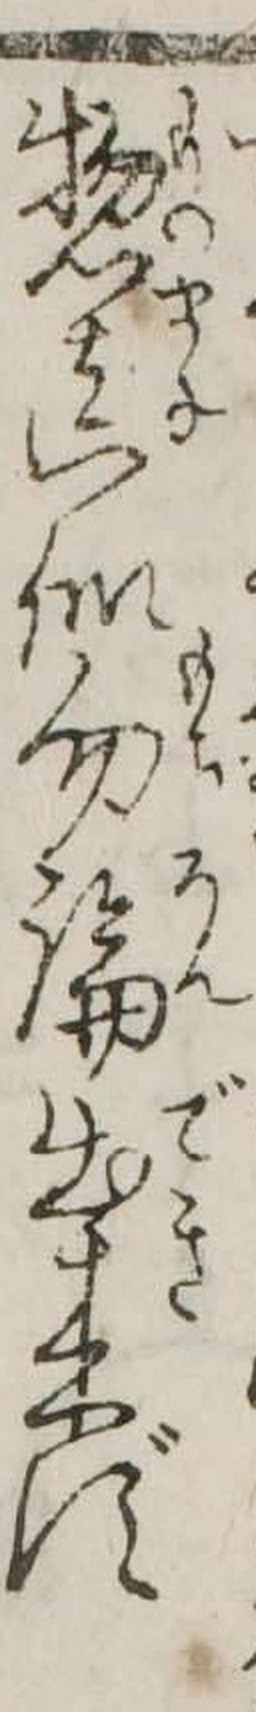惣真似勿論出来ず
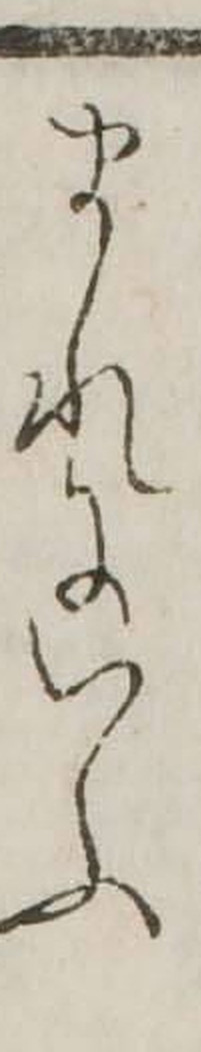まれにいふ
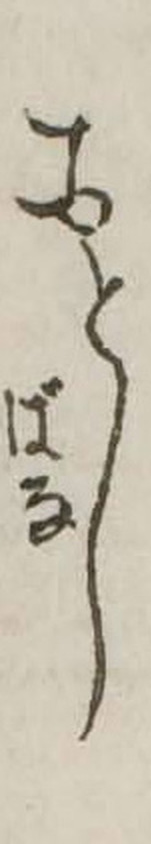おとし
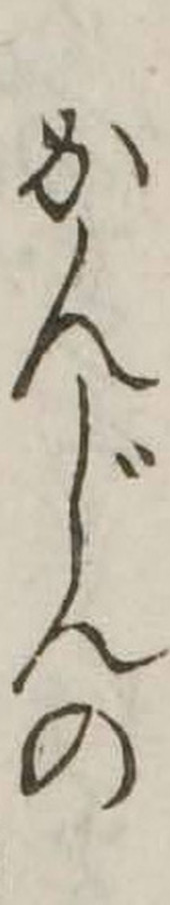かんじんの
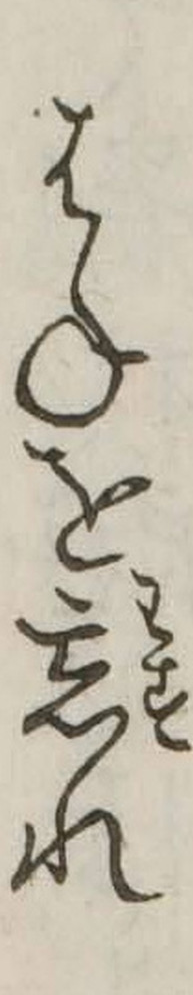はねを忘れ
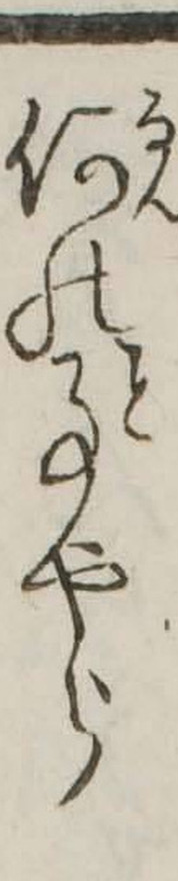何の事やら
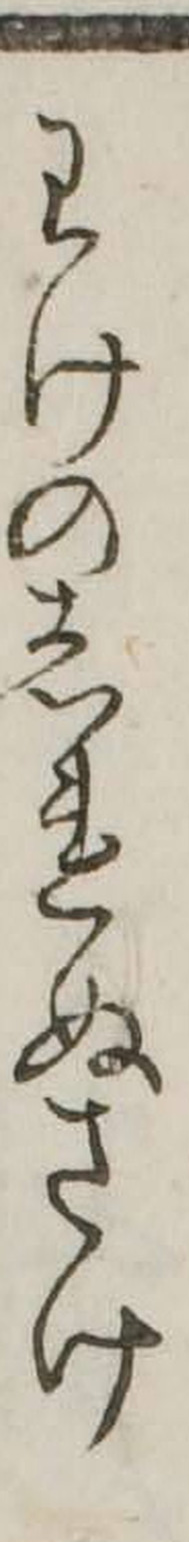わけのしれぬさけ
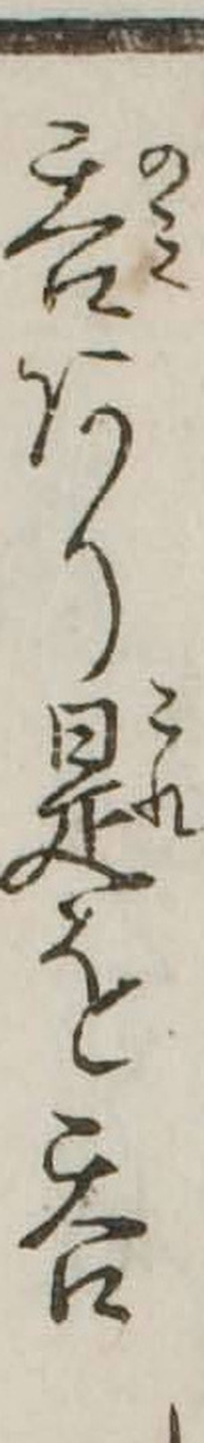呑あり是を呑
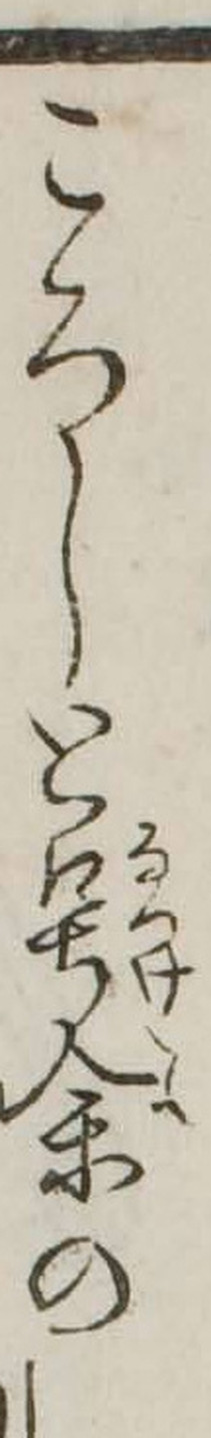ころしと号余の
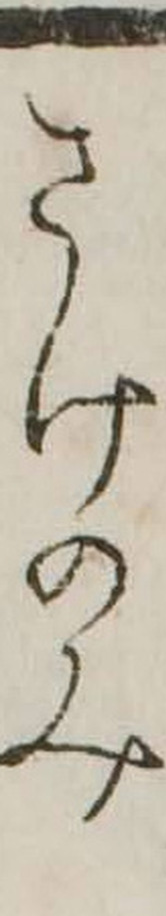さけのみ
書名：繪本不盡泉
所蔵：国文学研究資料館
